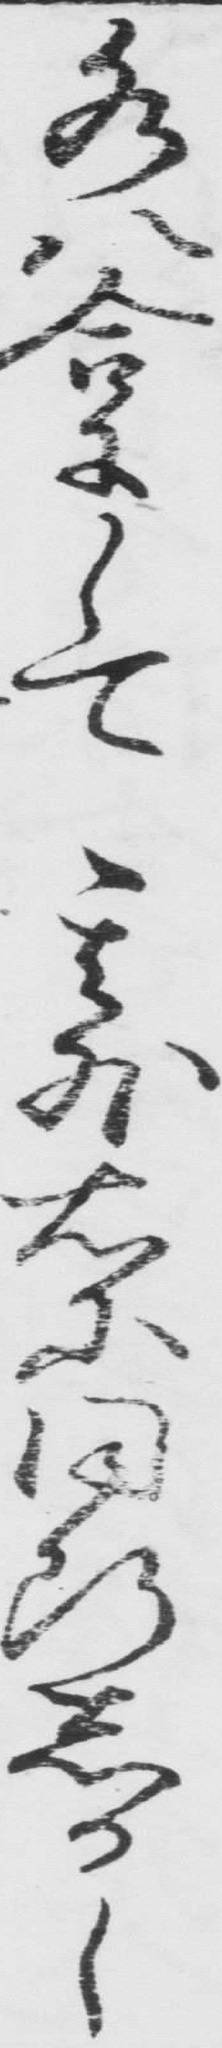水八合にして其外右に同断しかし
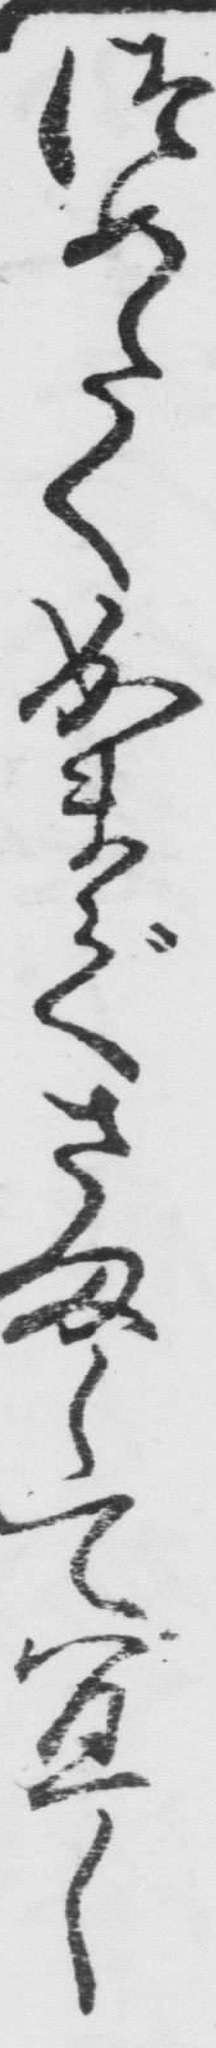つめたく成までさまして宜し
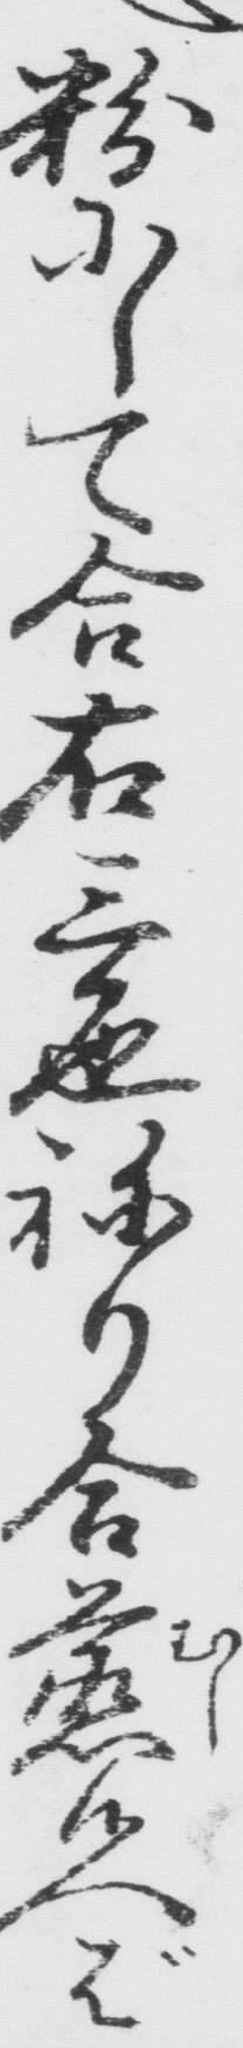粉にして合右三色ねり合蒸候へば
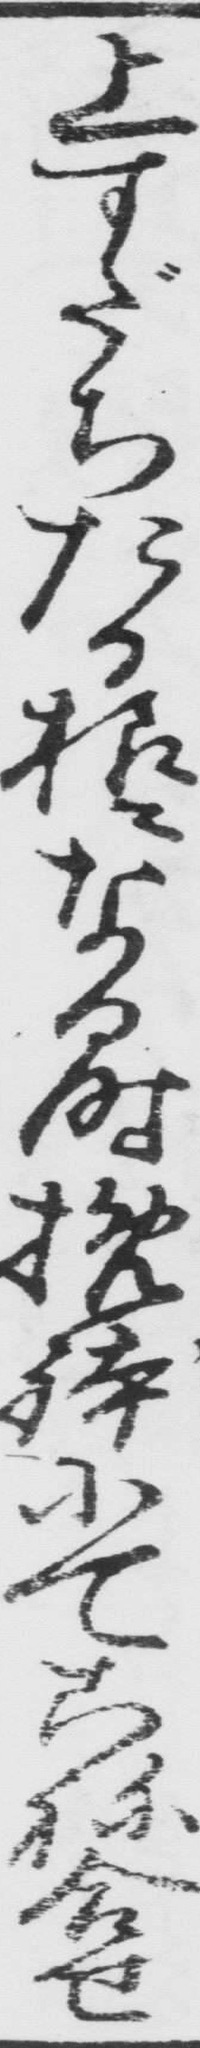上すだちたる様になる時挽鉢にてこね合せ

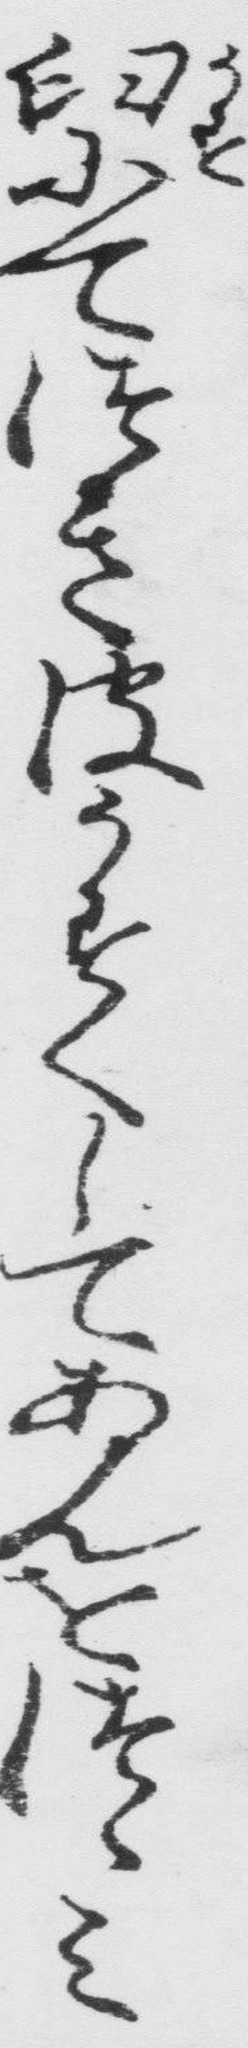臼にてつき皮うすくしてあんをつゝみ
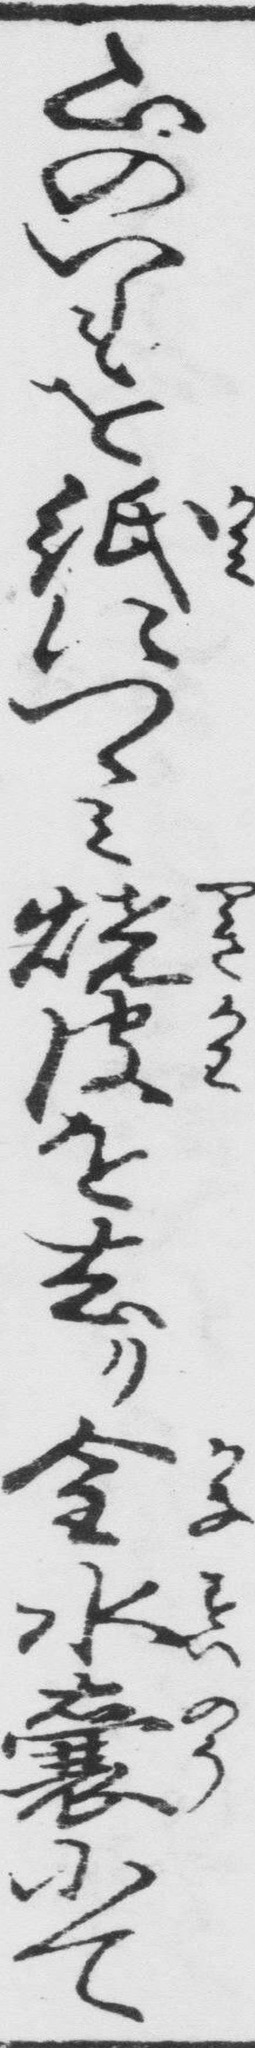山のいもを紙につゝみ焼皮を去り金水嚢にて
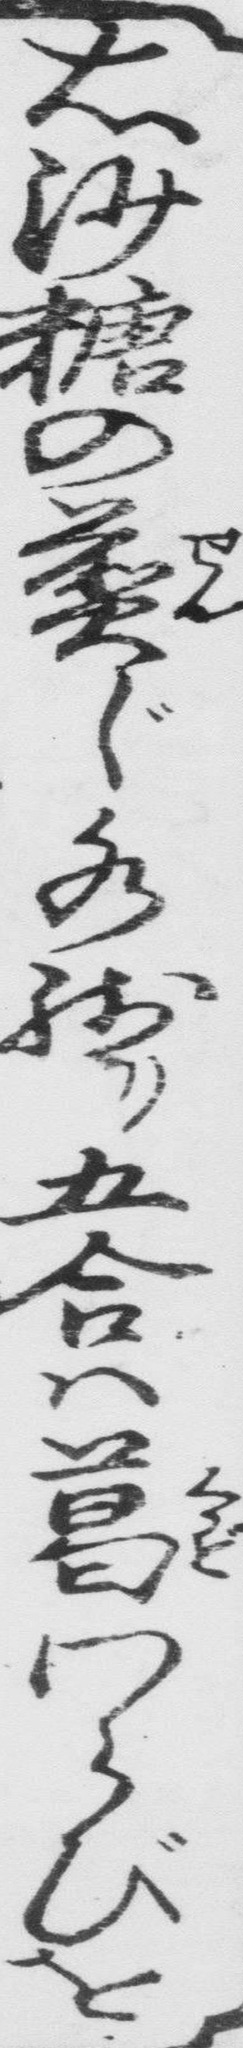右沙糖の煎じ水残り五合は葛わらびを
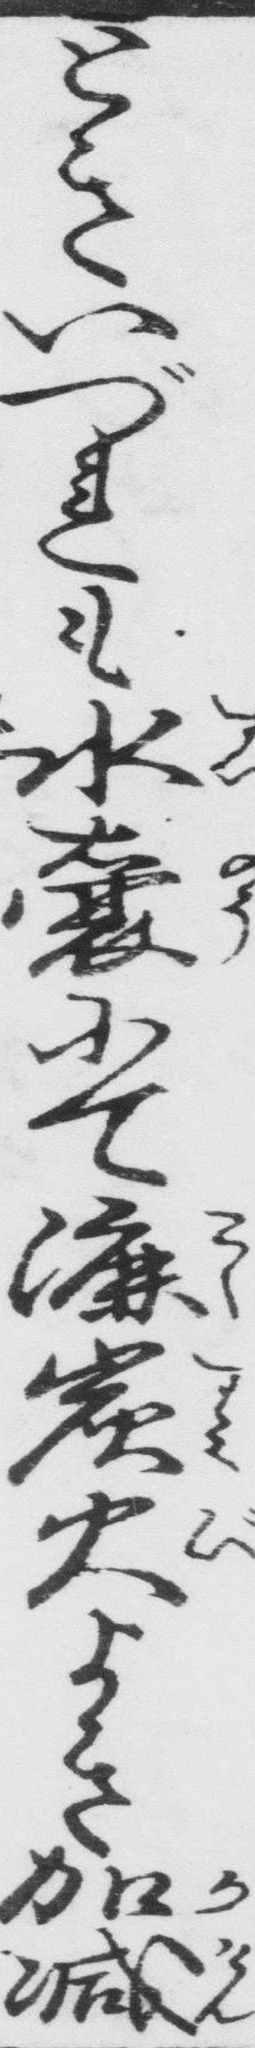ときいづれも水嚢にて漉炭火よき加減
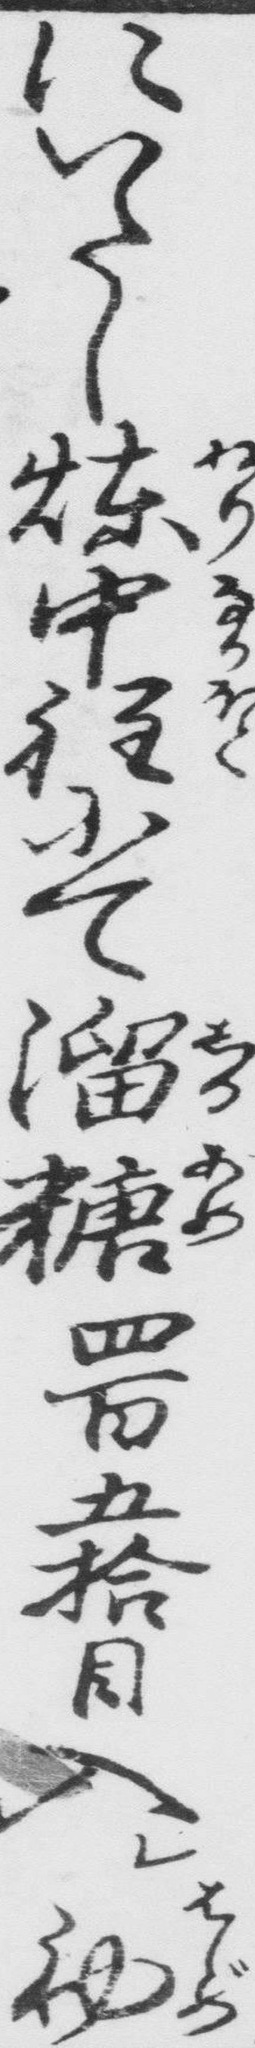にいたし煉中程にて溜糖四百五拾目入れ初
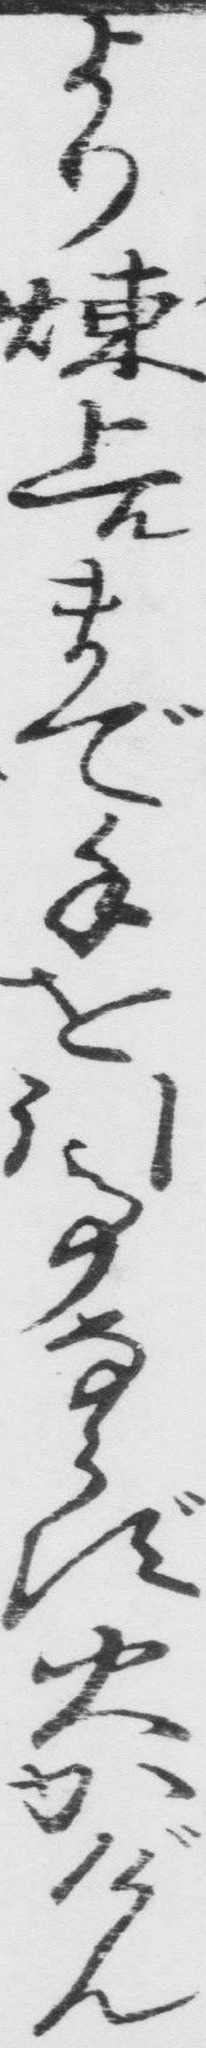より煉上るまで手を引事ならず火かげん
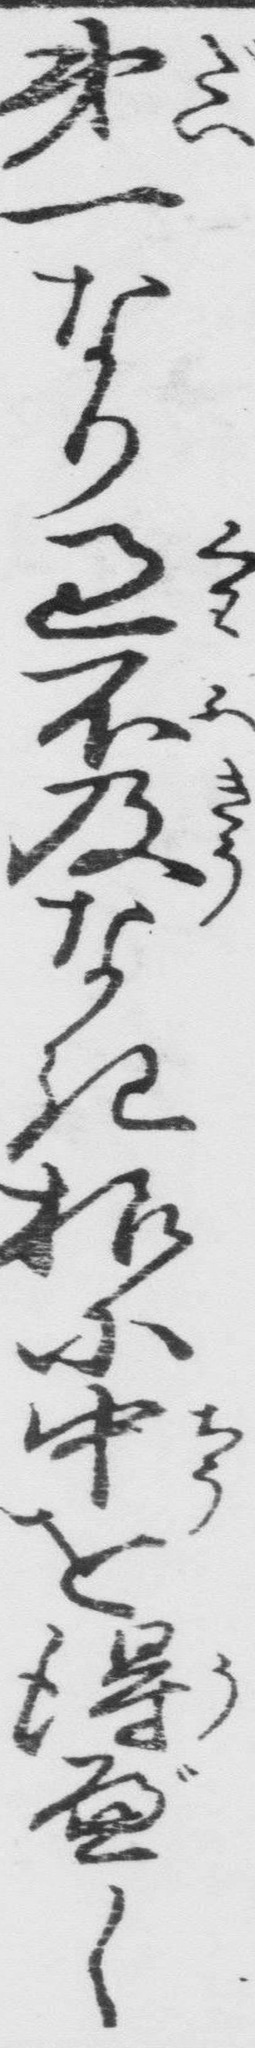第一なり過不及なき様に中を得べし
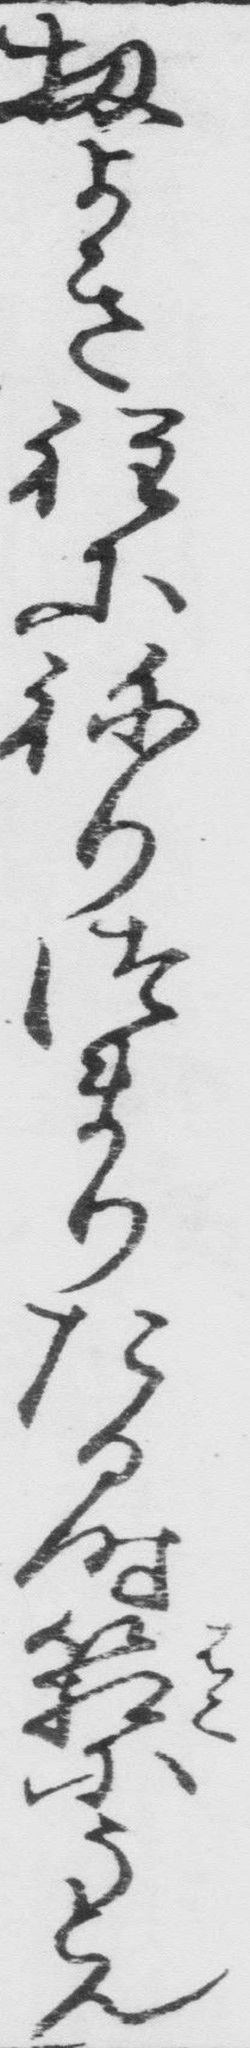扨よき程にねりつまりたる時箱にうとん
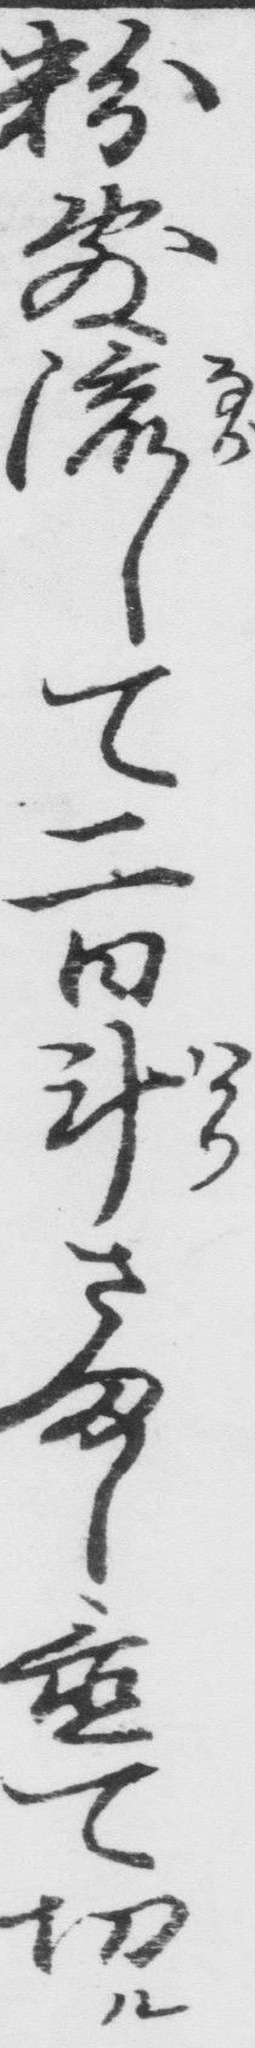粉敷流して二日斗さまし置て切る

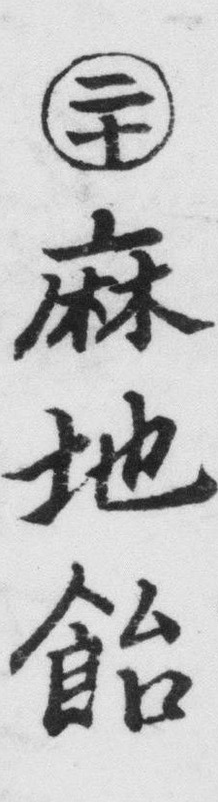(二十)麻地飴
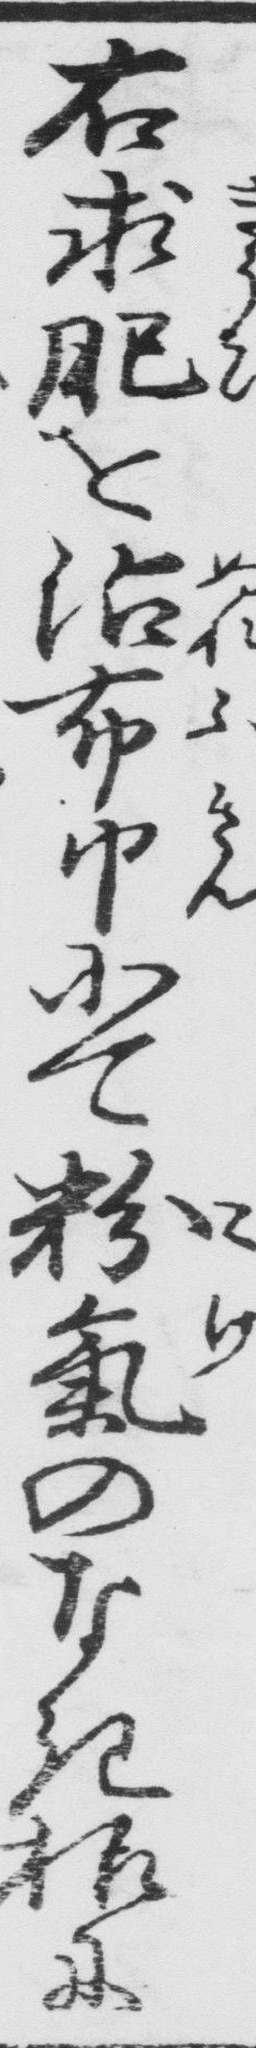右求肥を沾布巾にて粉気のなき様に
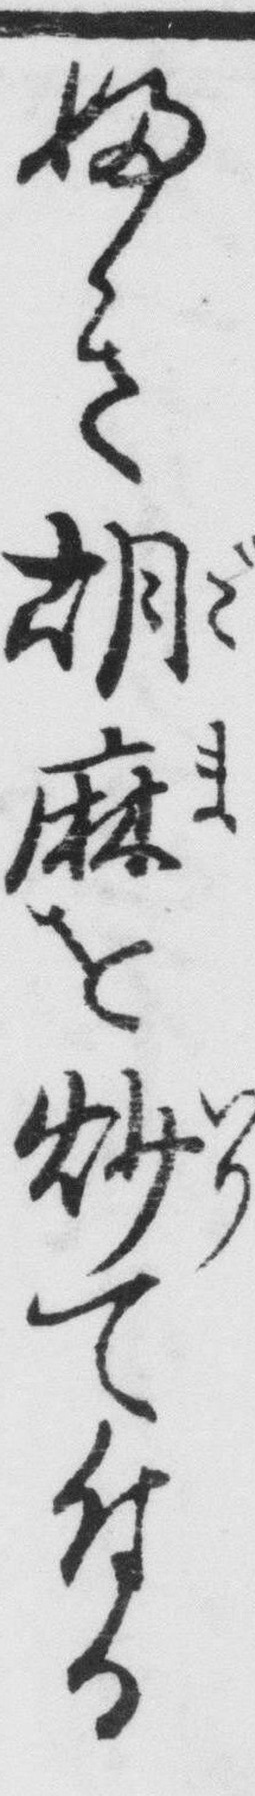ふき胡麻を炒て付る
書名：御前菓子図式
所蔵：大阪府立大学学術情報センター 国文学研究資料館
